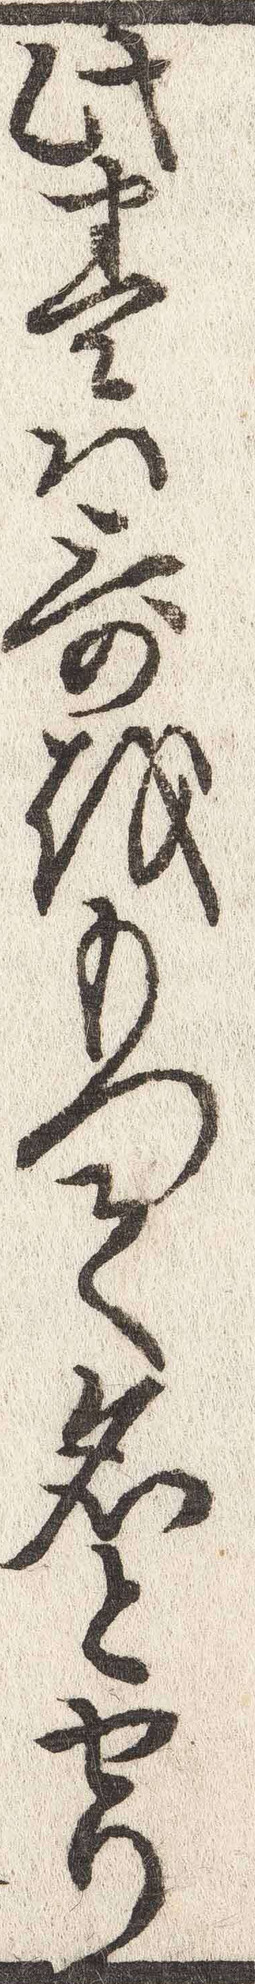此巻は歌をもつて名とせり
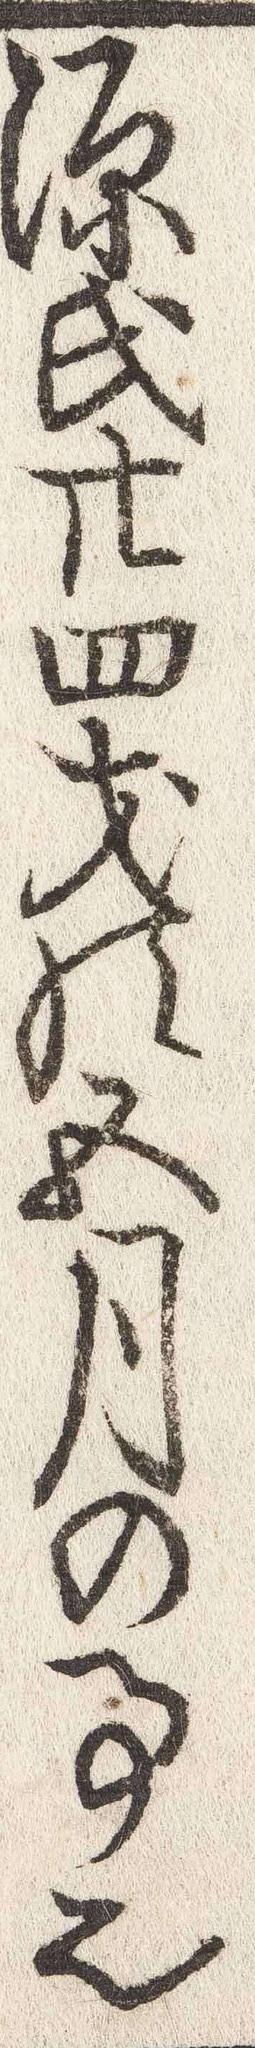源氏廿四才の五月の事也
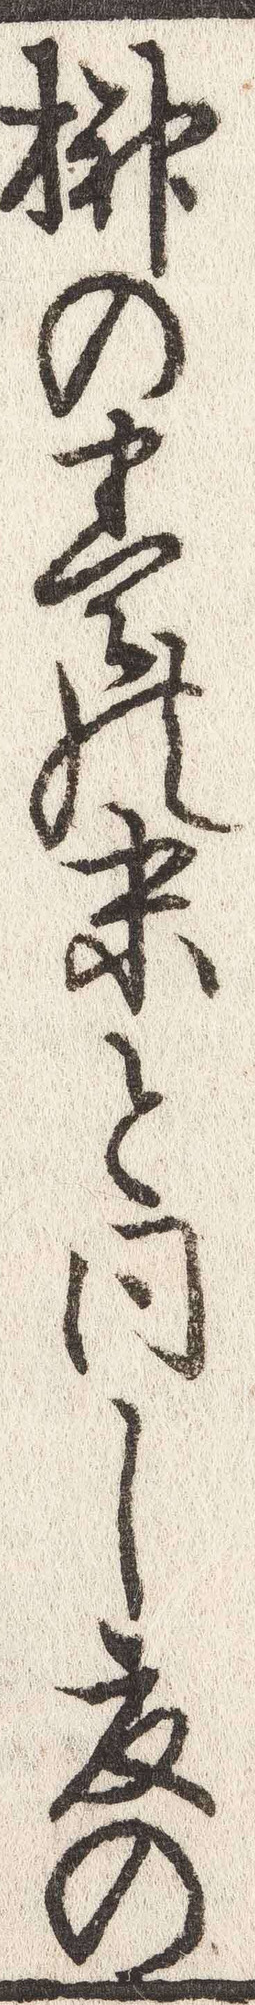榊の巻の末と同し夏の
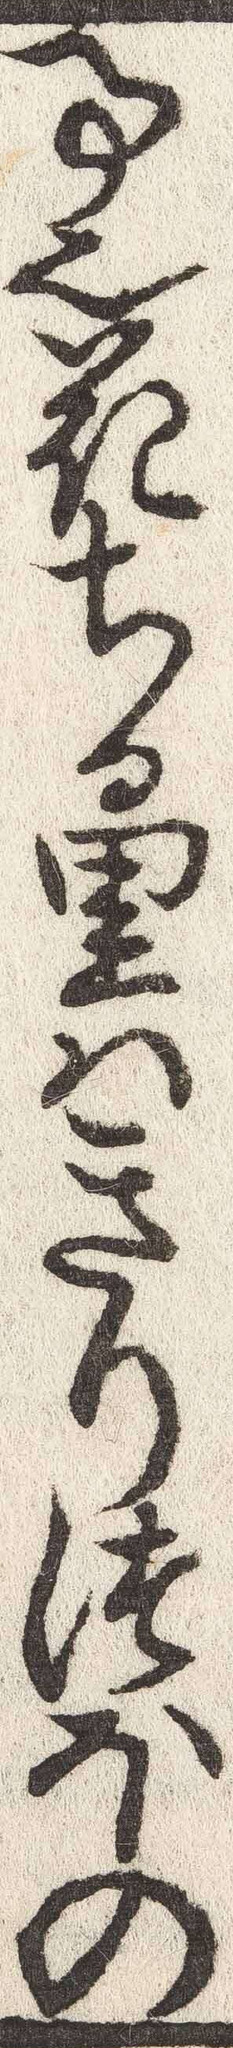事也花ちる里はきりつほの
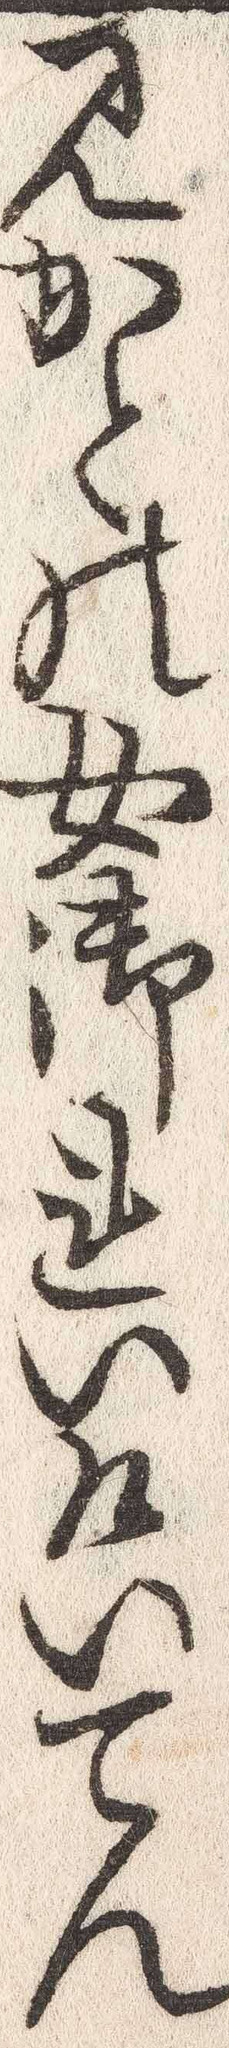みかとの女御れいけいてん
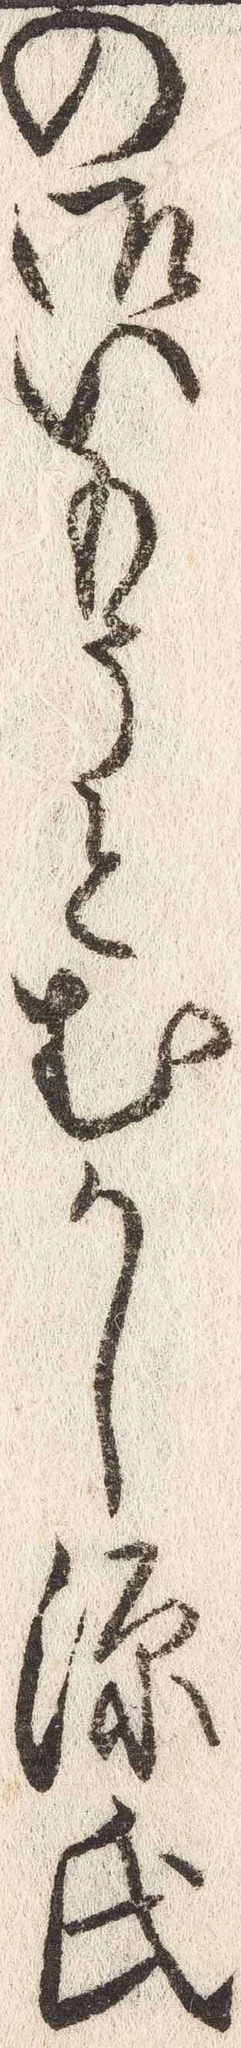の御いもうとむかし源氏
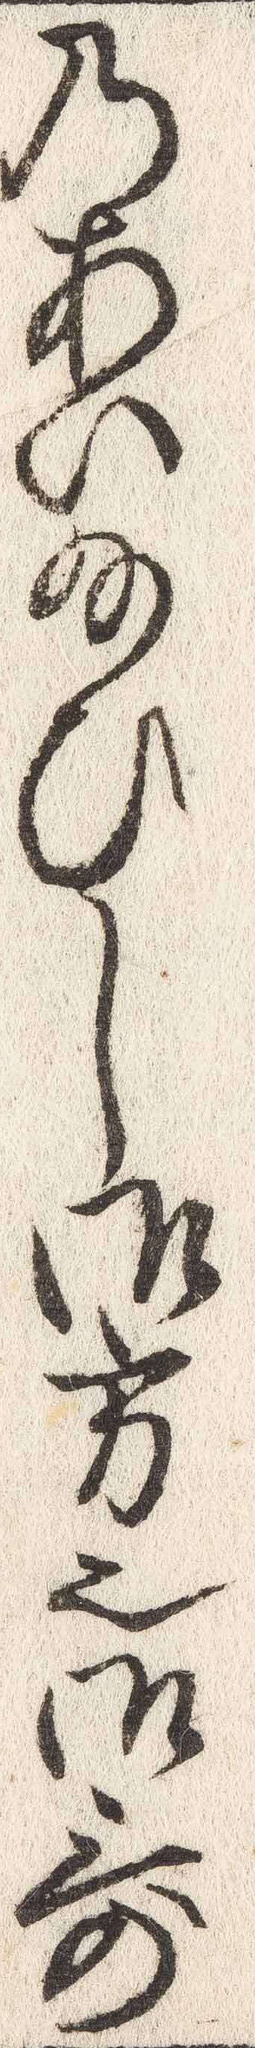のあい給ひし御方也御歌
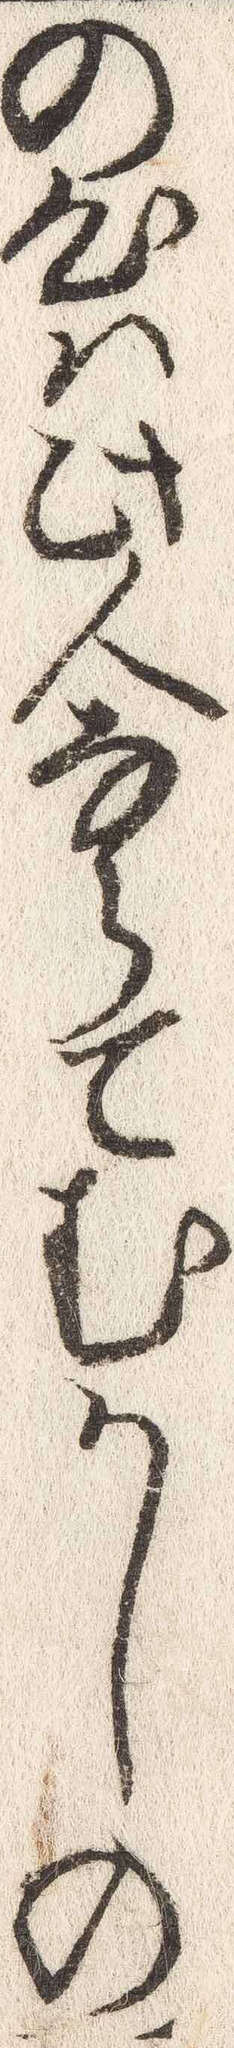の心は此人ならてむかしの
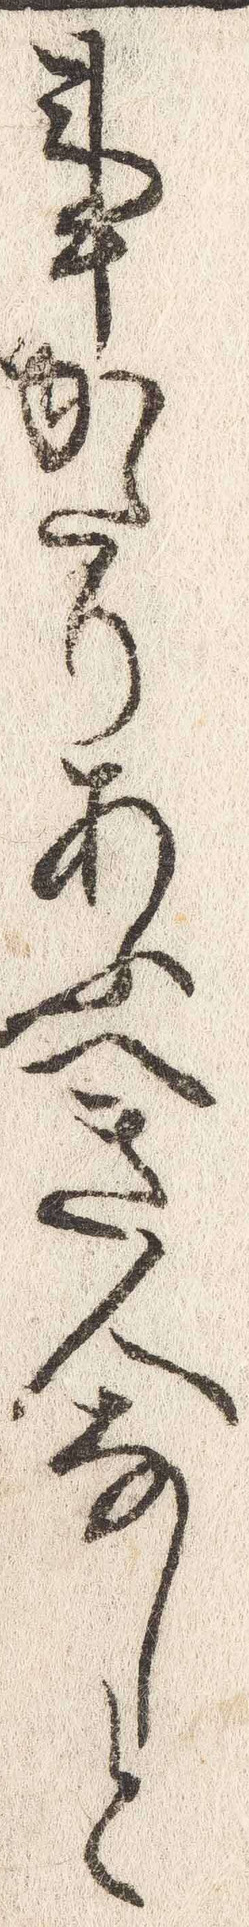事かたりあふへき人なしと

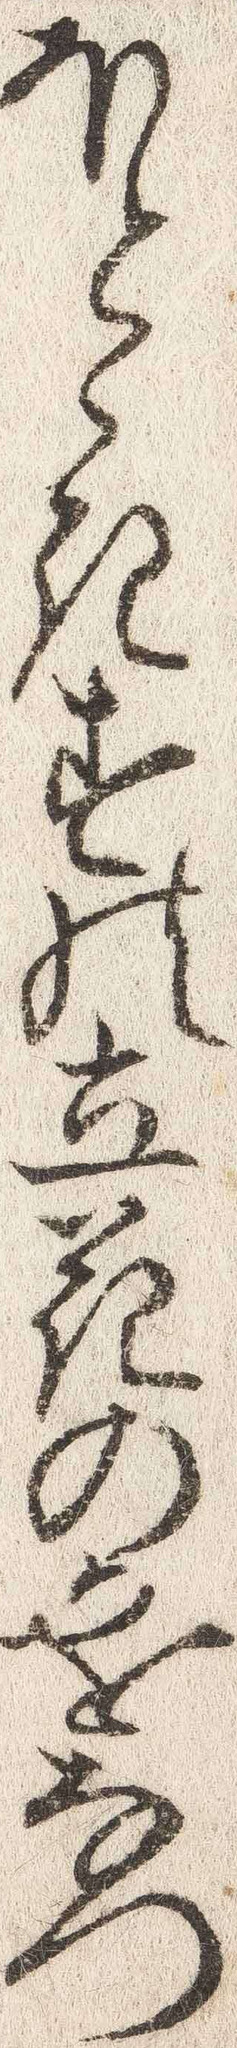ほとゝきすの立花のかをなつ
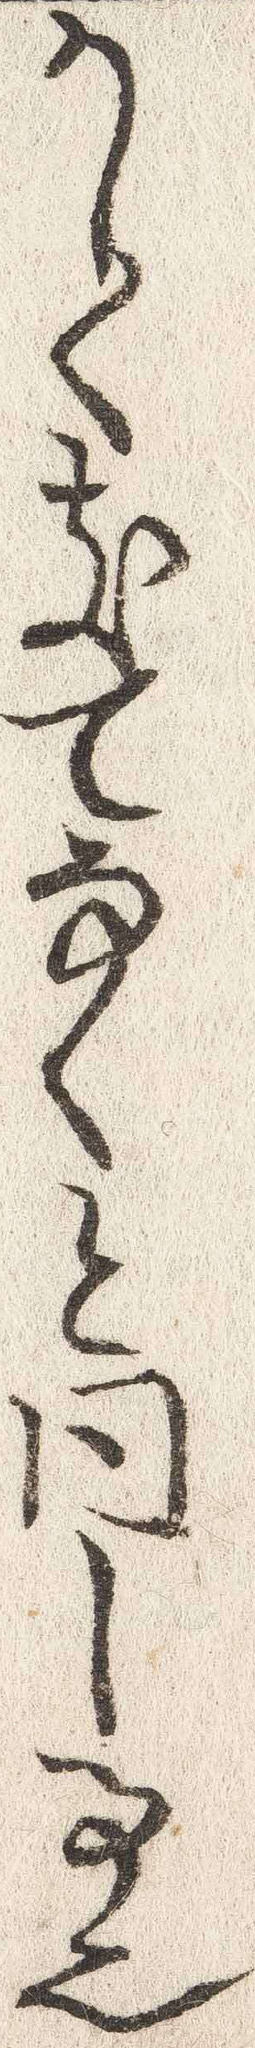かしくきてなくと同し事也
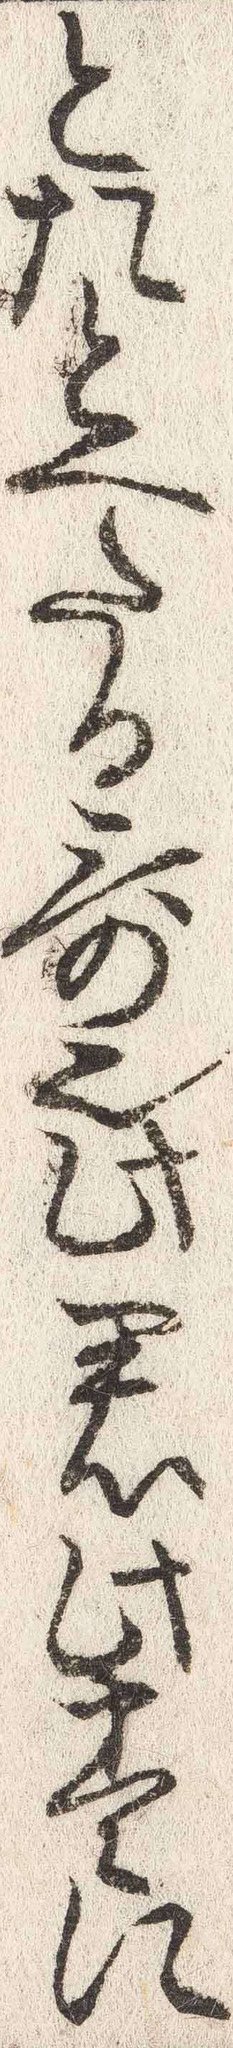とたとへたる歌也此君此巻に
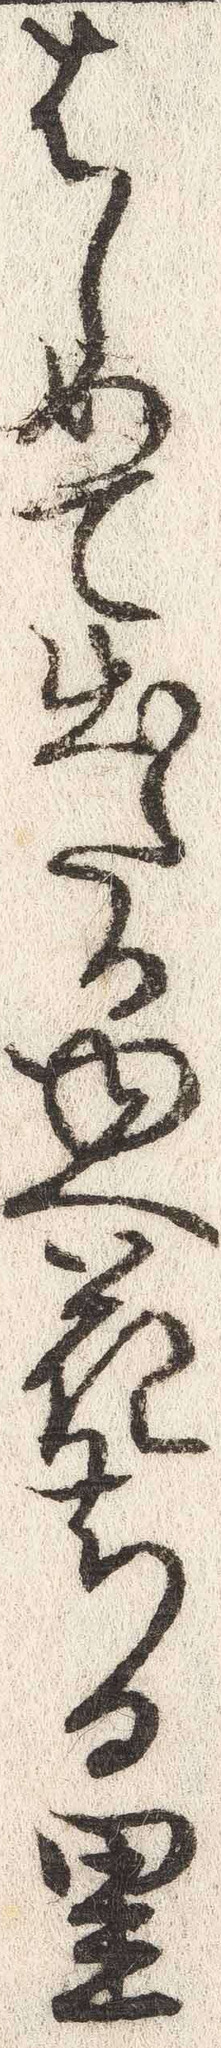はしめて出たるゆへ花ちる里
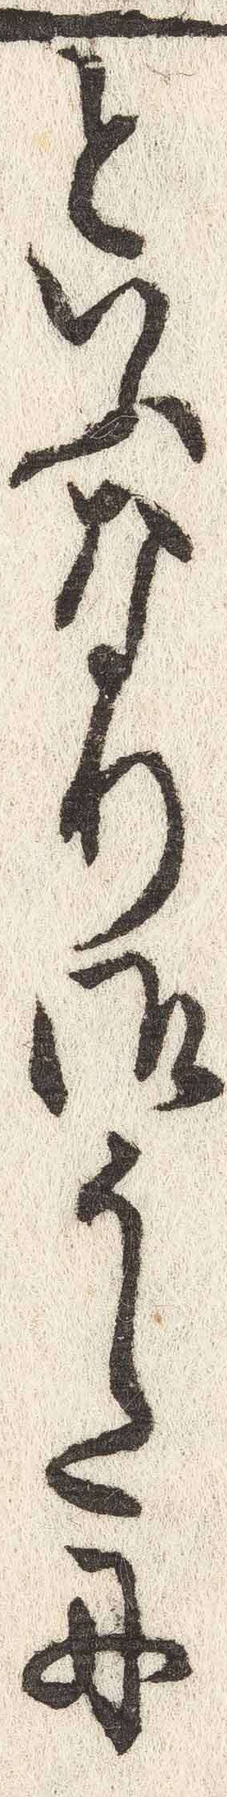といふなり御うたに
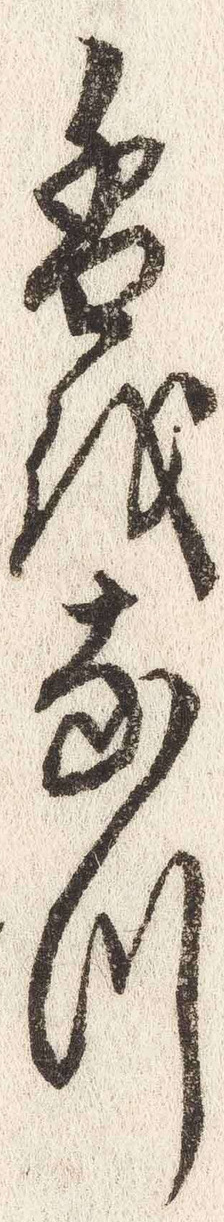香をなつ
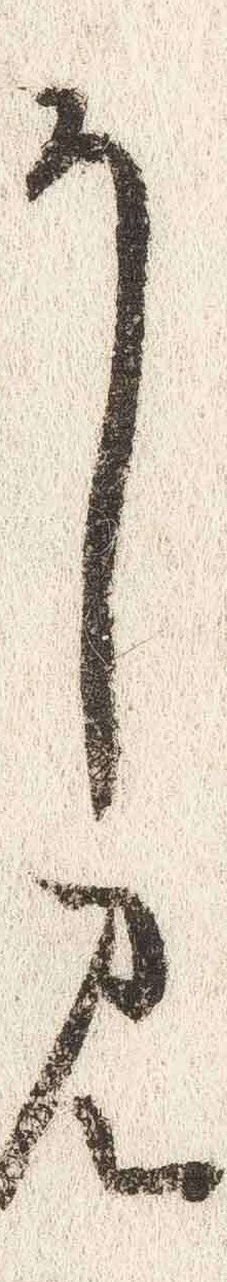かしみ
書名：源氏物語
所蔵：東京学芸大学附属図書館 国文学研究資料館
